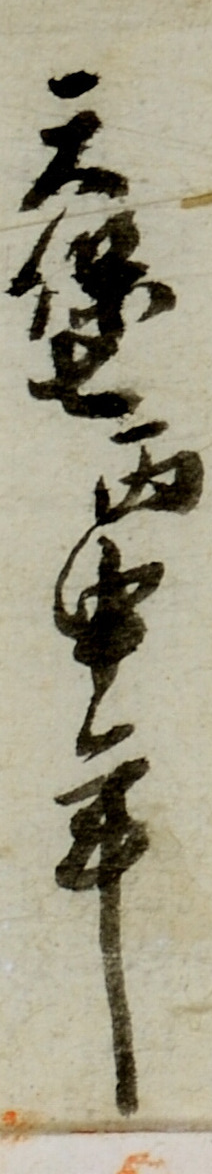天保七丙申年
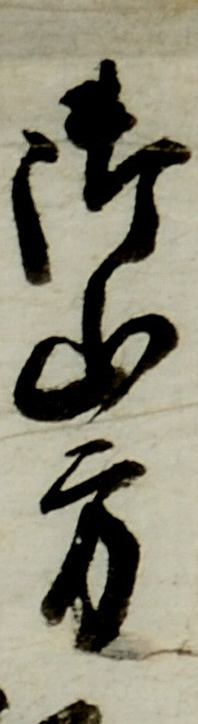御山方
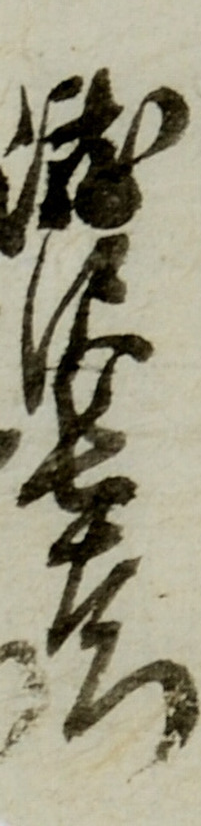三沢深右衛門
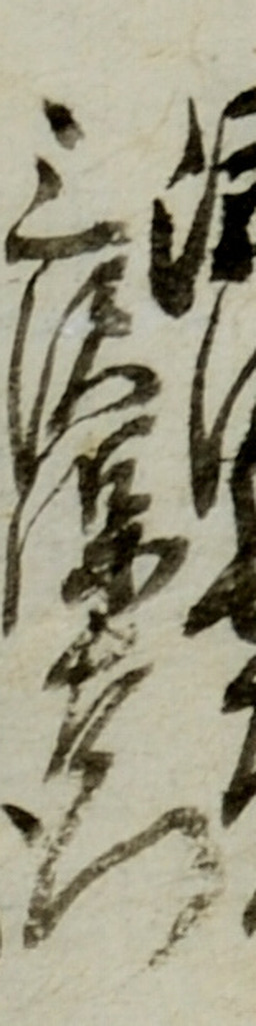三沢深右衛門
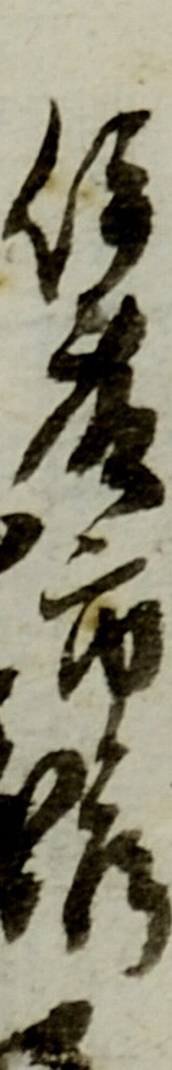伊藤市蔵
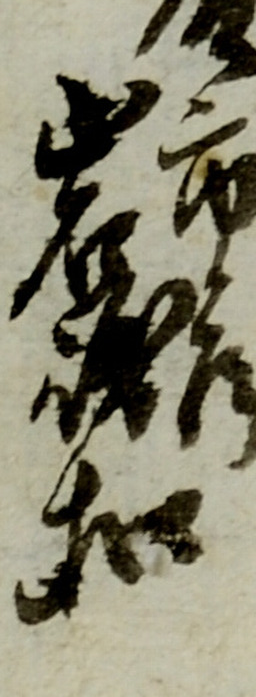岩崎扣
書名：御山方御薪方御用留抜書控
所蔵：伊那市立高遠町図書館・合同会社AMANE
